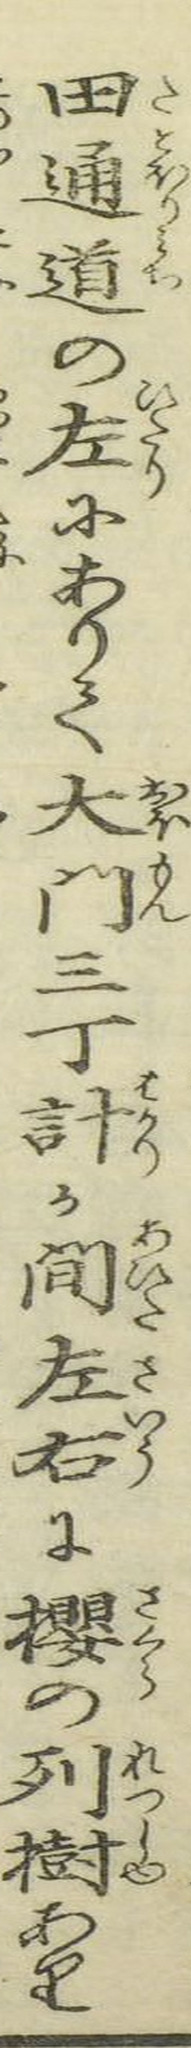田通道の左にありて大門三丁計か間左右に櫻の列樹あり
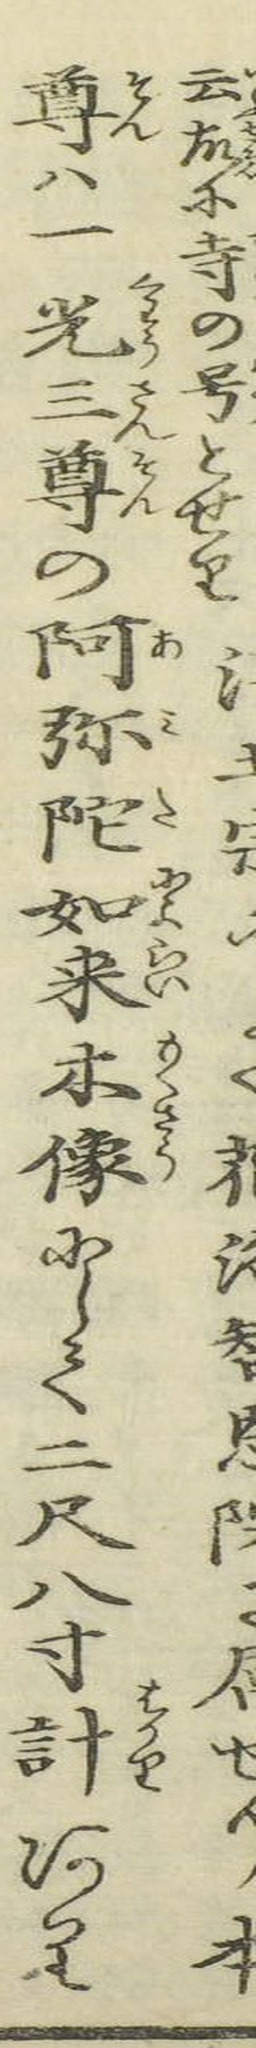尊は一光三尊の阿弥陀如来木像にして二尺八寸計あり
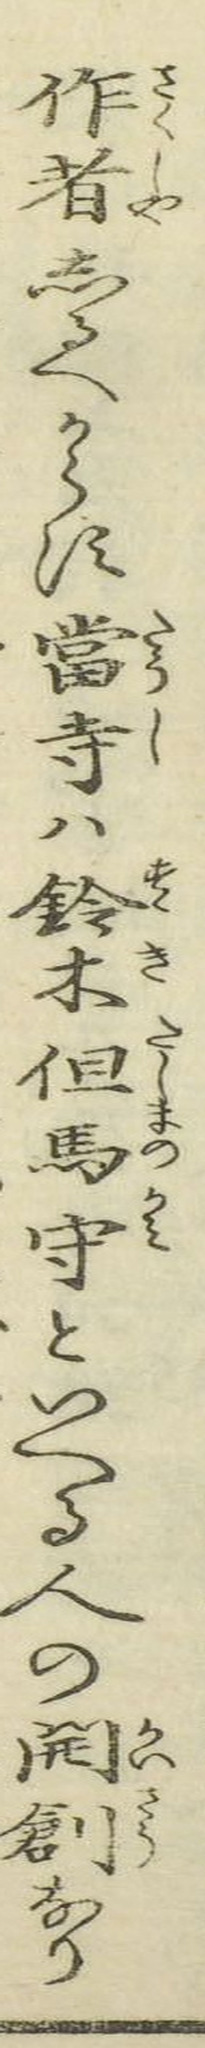作者しるへからす當寺は鈴木但馬守といへる人の開創なり
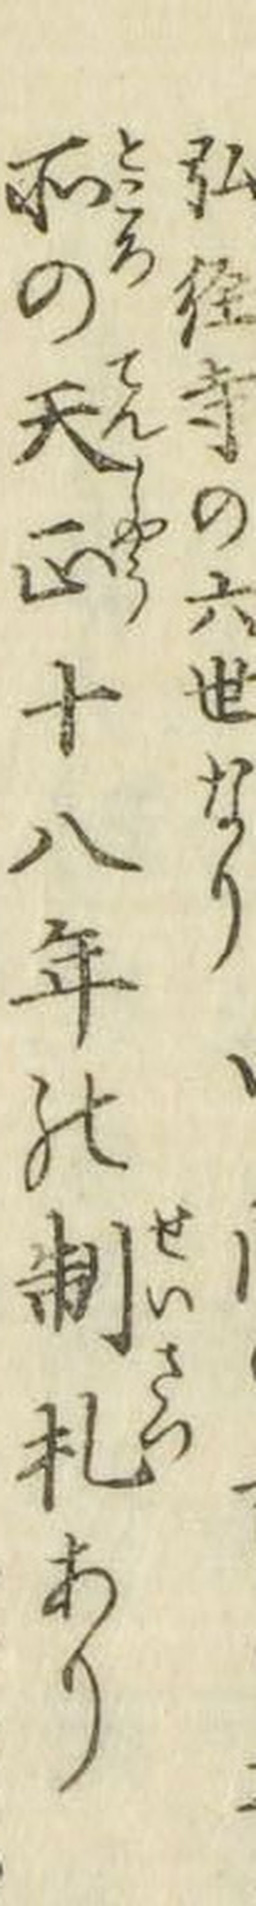所の天正十八年の制札あり
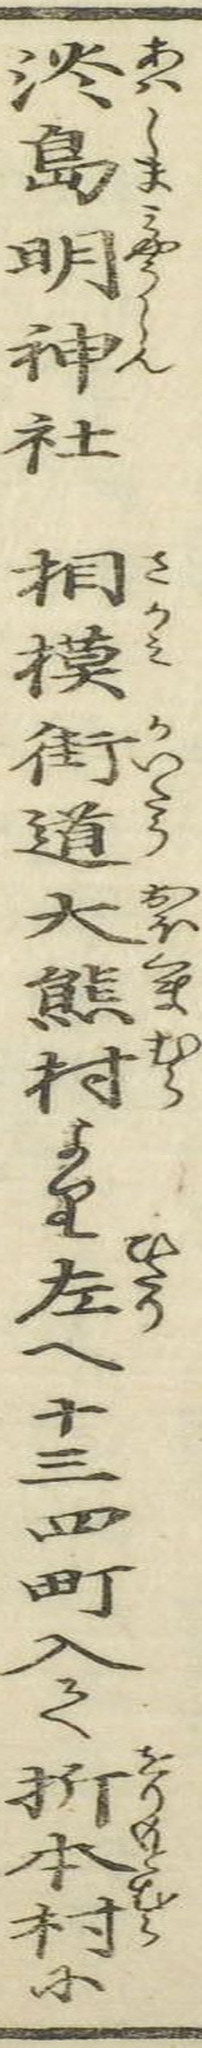淡島明神社相模街道大熊村より左へ十三四町入て折本村に
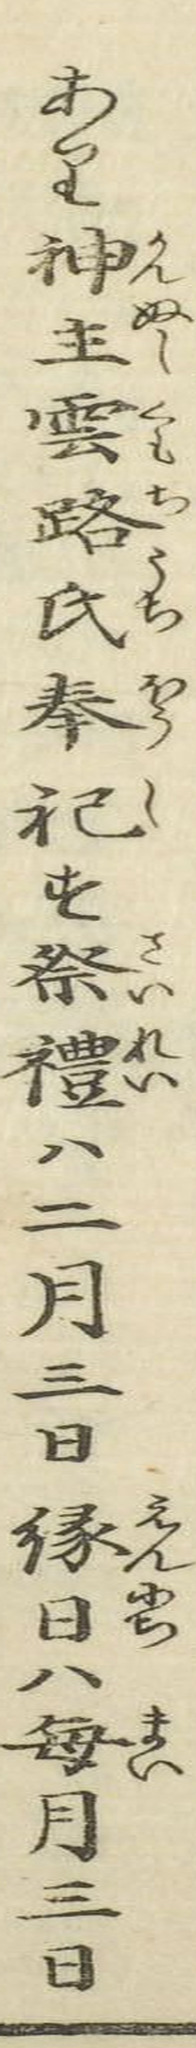あり神主雲路氏奉祀す祭禮は二月三日縁日は毎月三日
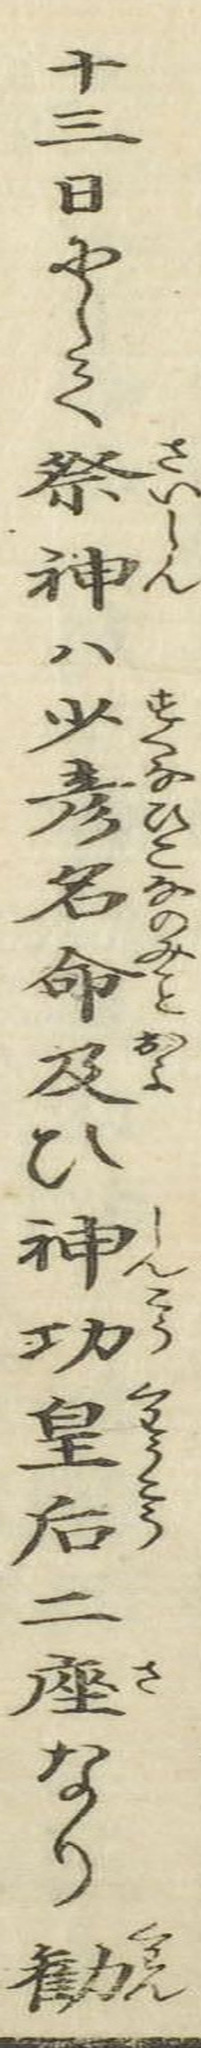十三日にして祭神は少彦名命及ひ神功皇后二座なり勧
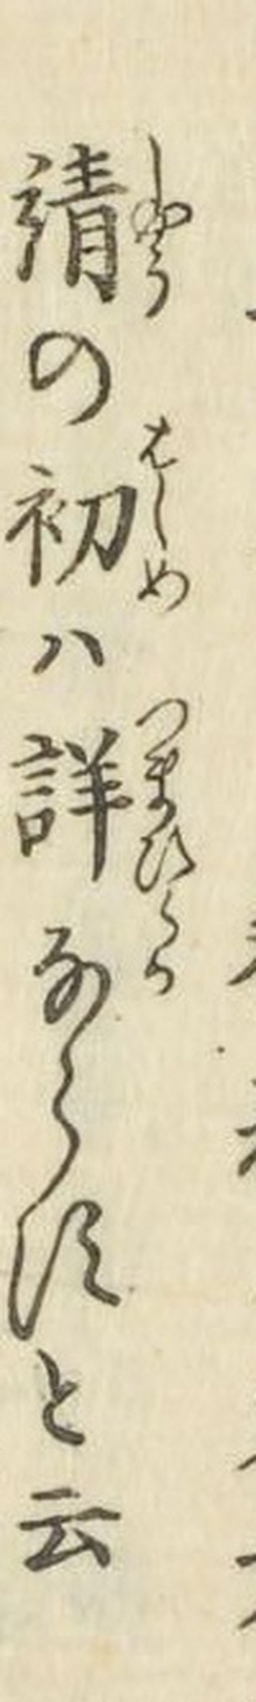請の初は詳ならすと云
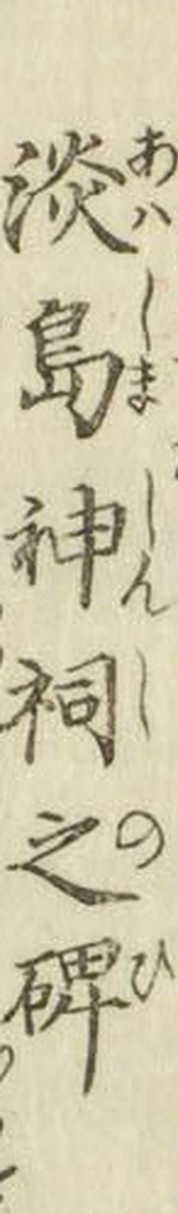淡島神祠之碑
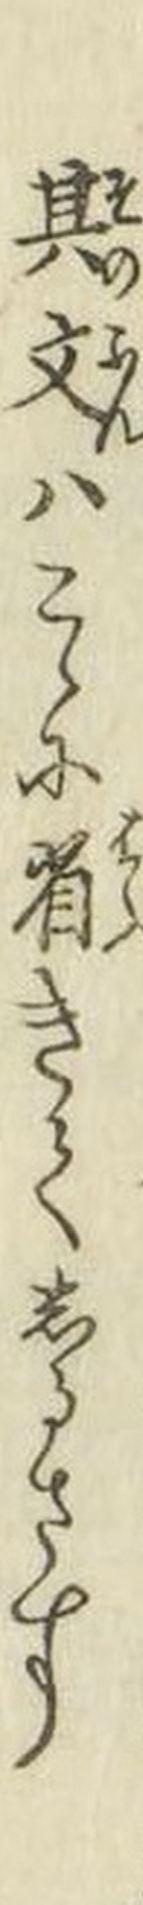其文はこゝに省きてしるさす
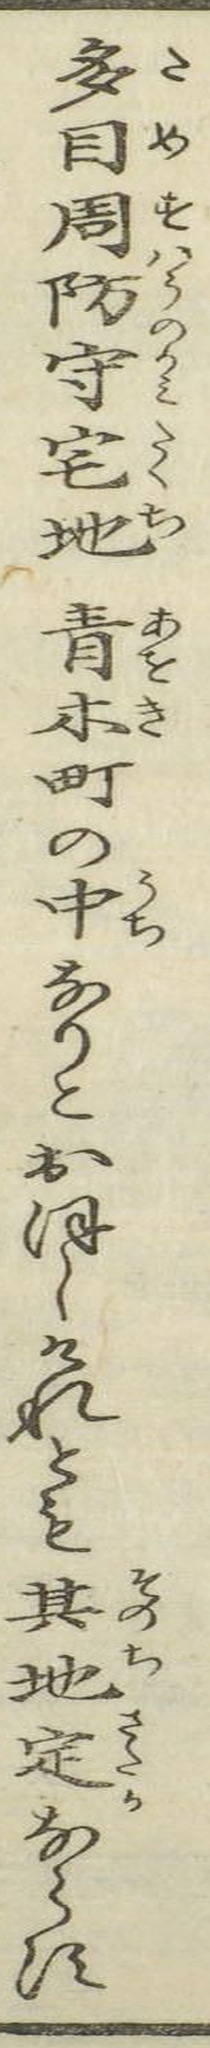多目周防守宅地青木町の中なりとおほしけれとも其地定ならす
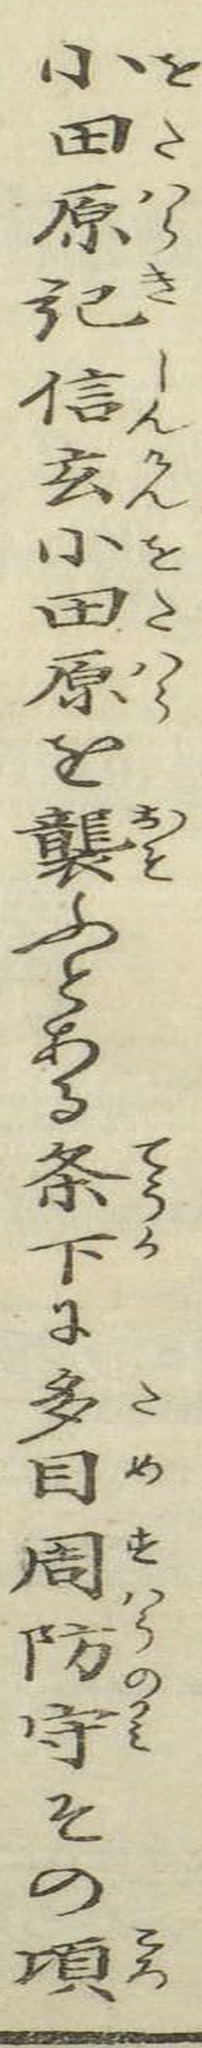小田原記信玄小田原を襲ふとある条下に多目周防守その頃

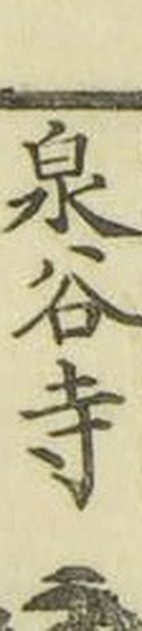泉谷寺

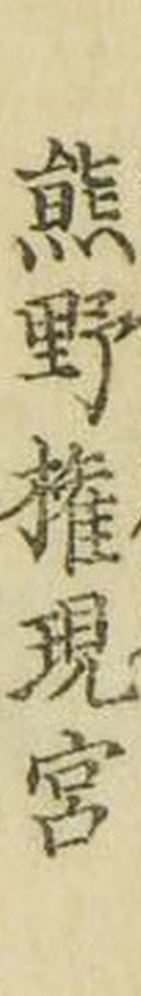熊野権現宮

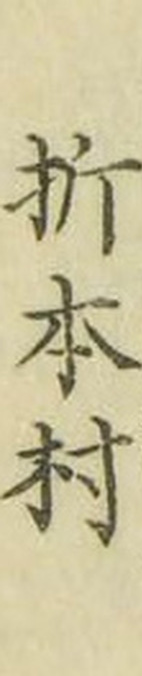折本村
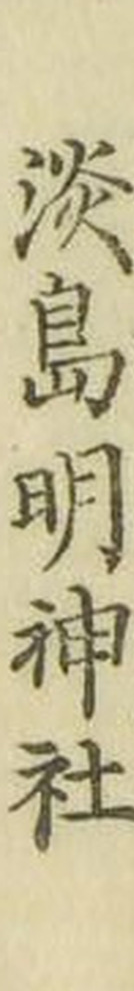淡島明神社
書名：江戸名所図会 20巻 巻之5
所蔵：東京学芸大学教育コンテンツアーカイブ
